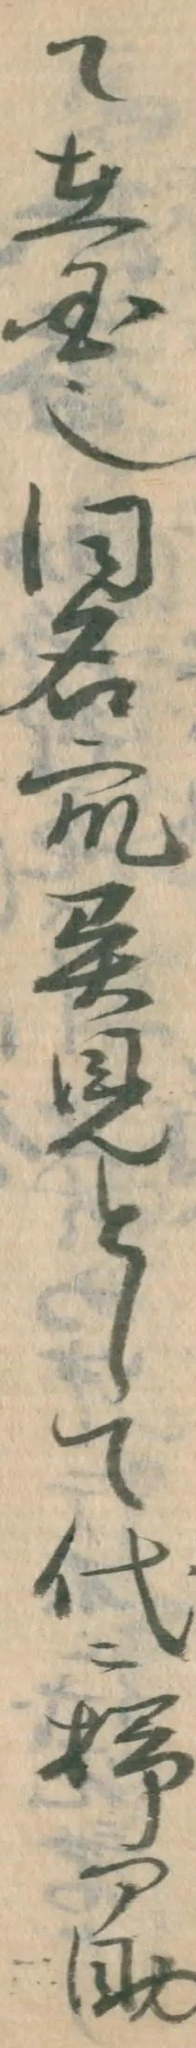て在国也同名衆異見として代ニ掃部助
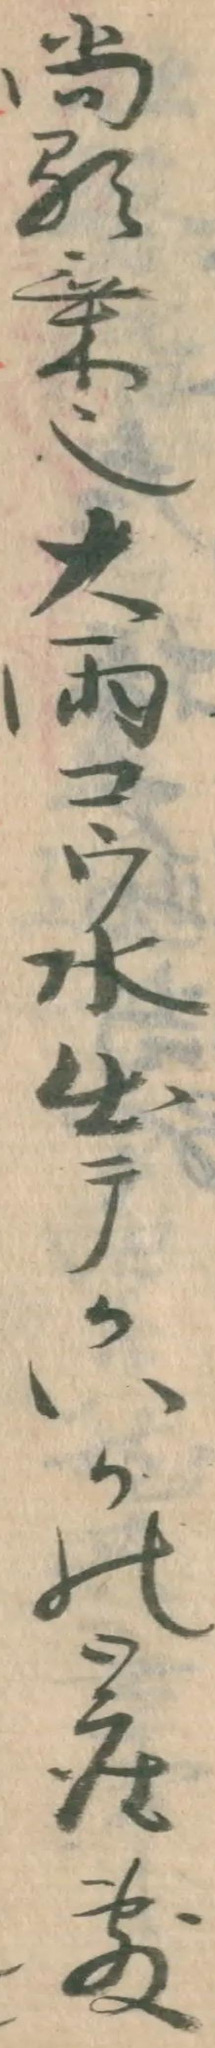尚顕乗也大雨コウ水出テかいかの御座敷
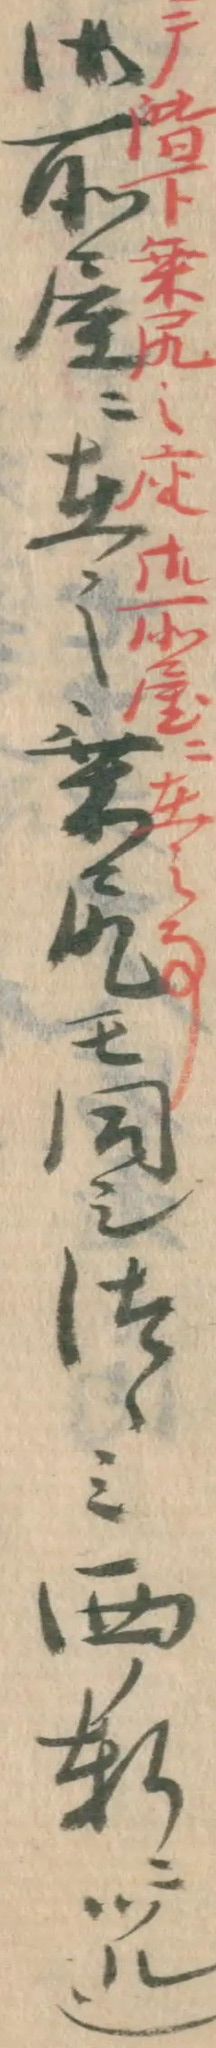御所屋ニ在之乗尻モ同シつゝミ西ノ軒ニツル也
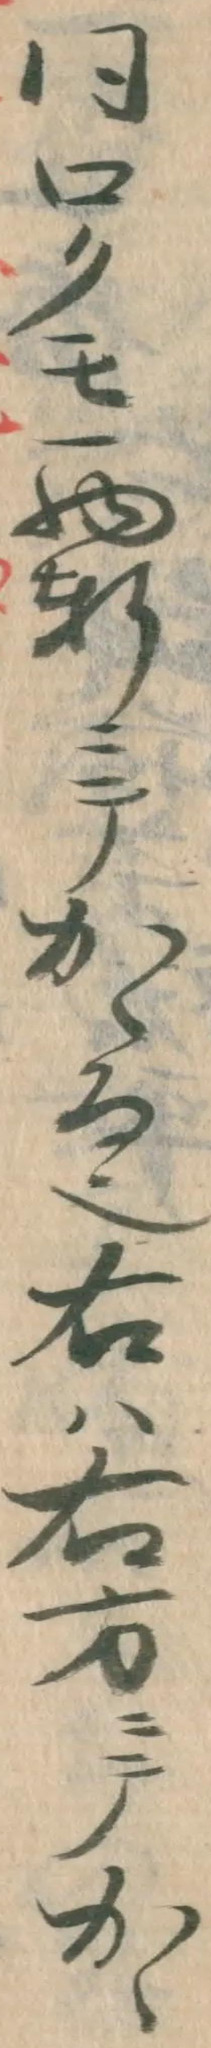同ロクモ西軒ニテかゝる也右ハ右方ニテかゝ
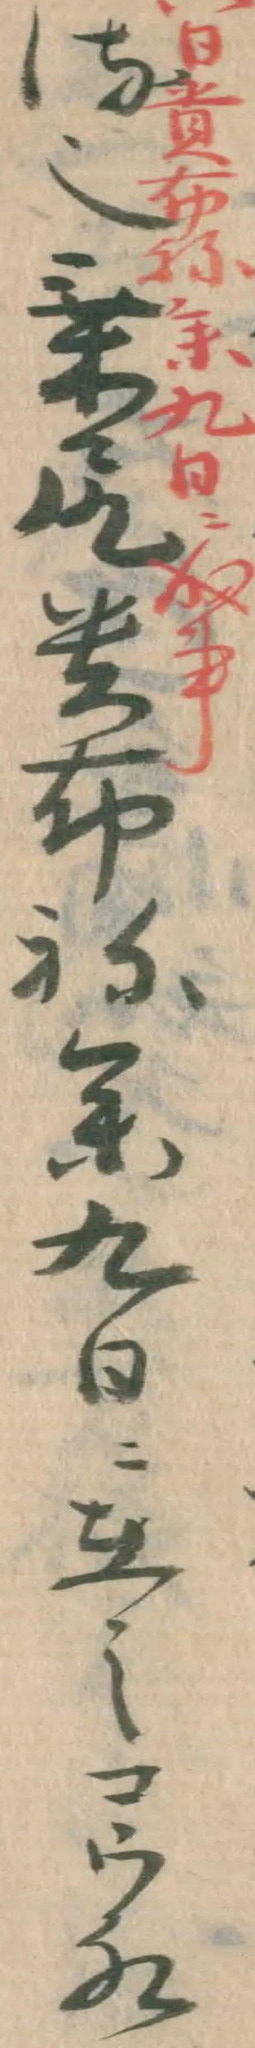る也乗尻貴布ふね参九日ニ在之コウ水
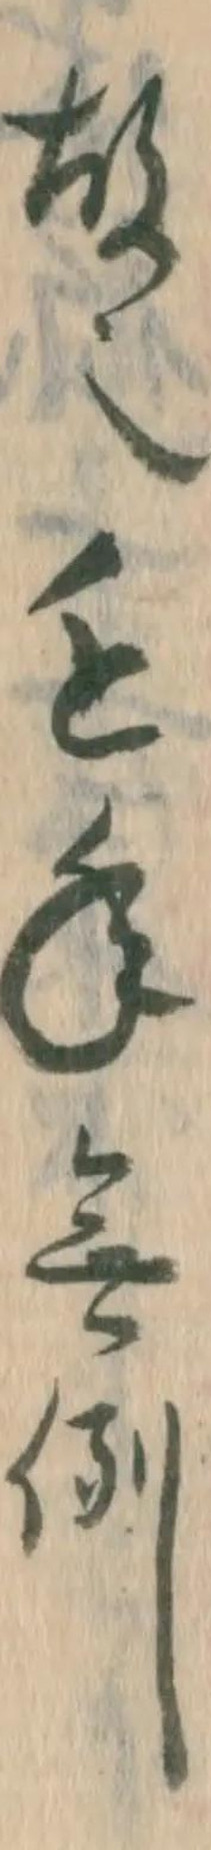故之近年無例
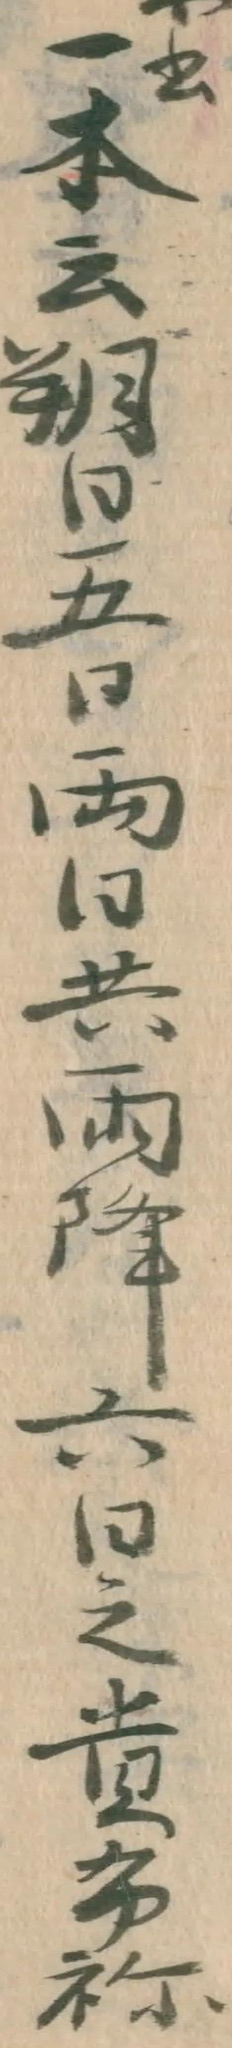一本云朔日五日両日共雨降六日之貴ふね
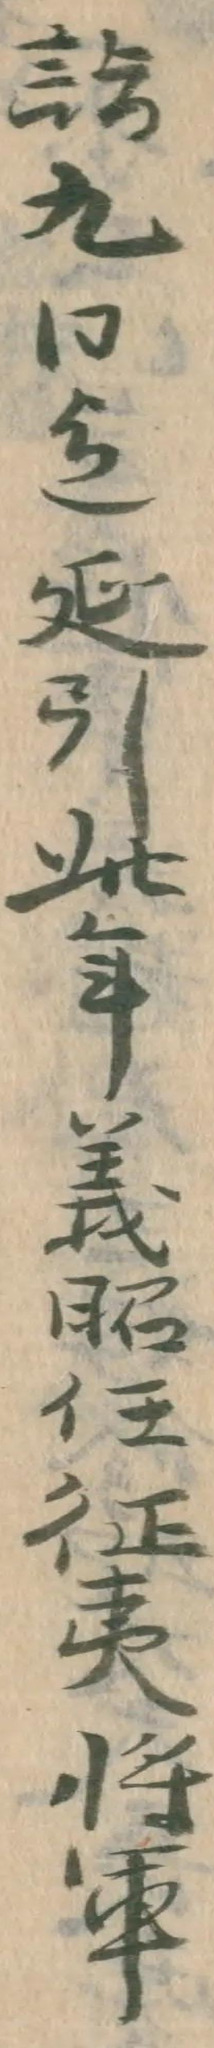詣九日迄延引此年義昭任征夷将軍
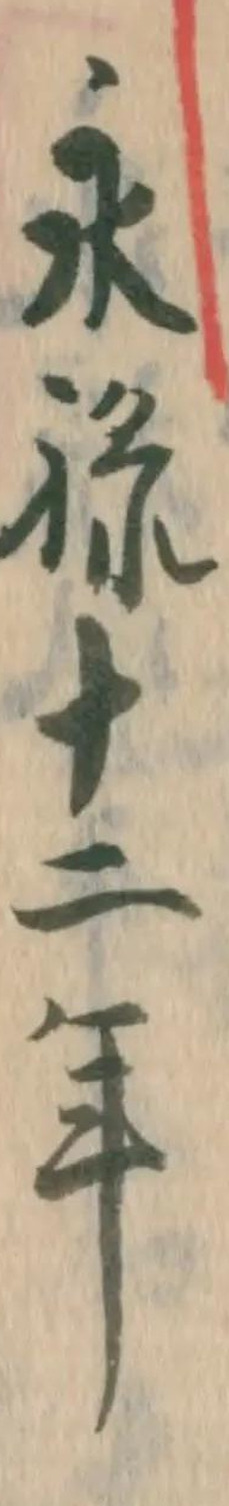永禄十二年
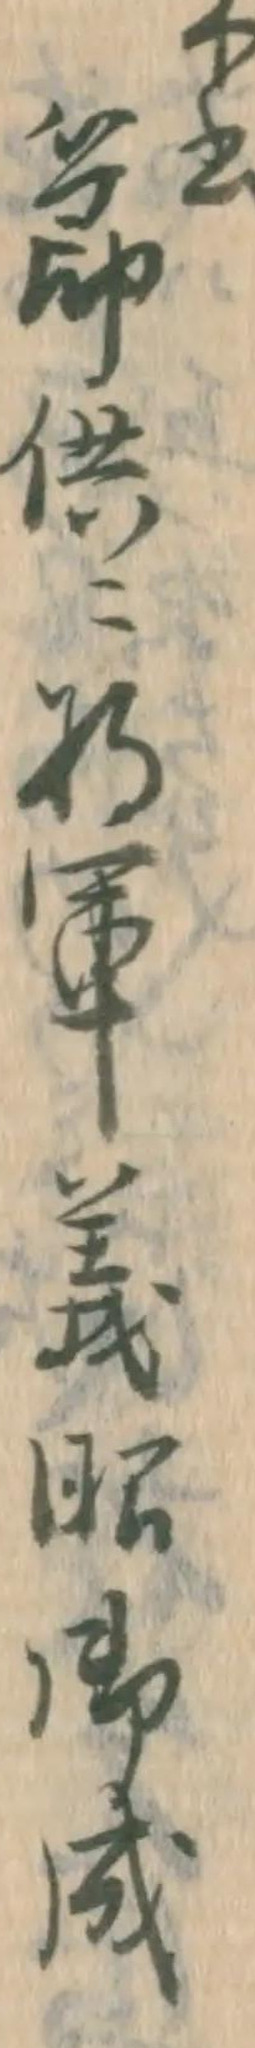節供ニ将軍義昭御成
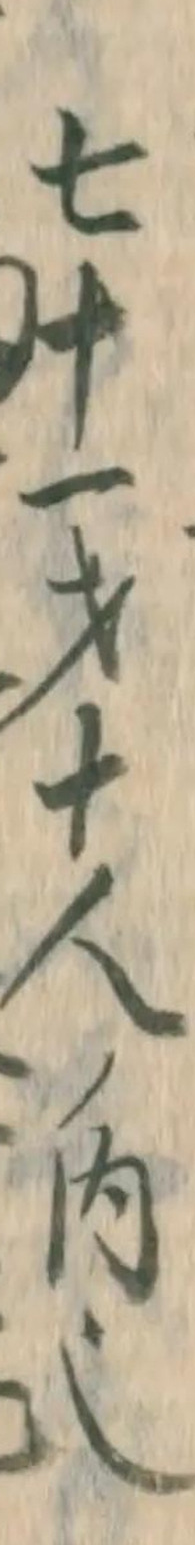七十一才十人ノ内也
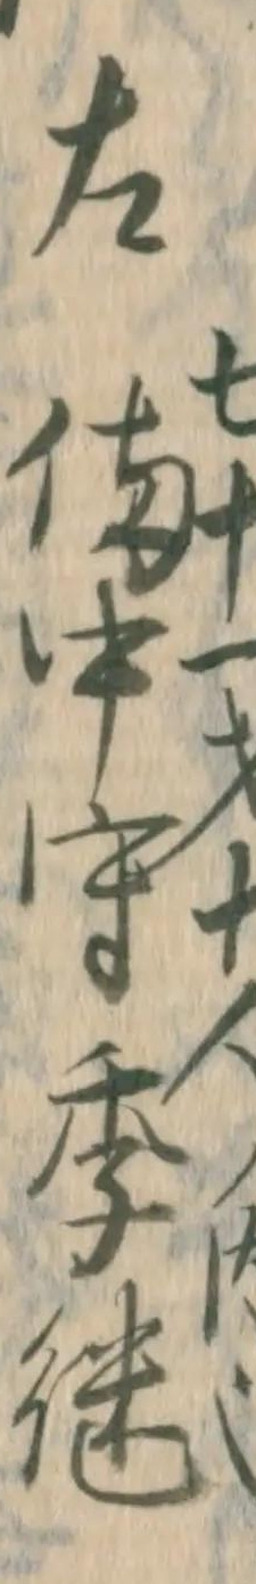左備中守季継
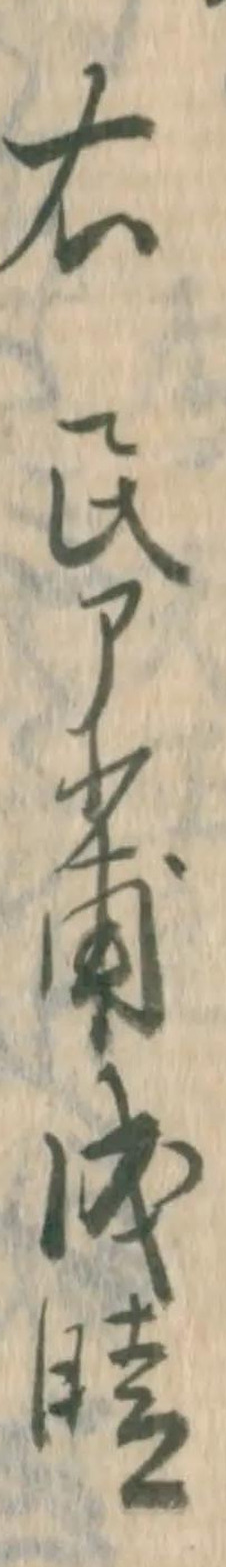右民部少輔成晴
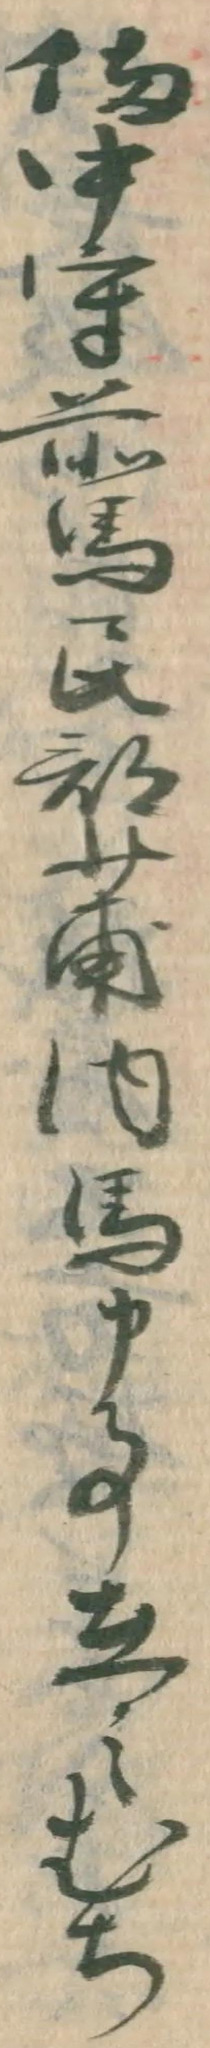備中守前馬民部少輔内馬申事在之むち
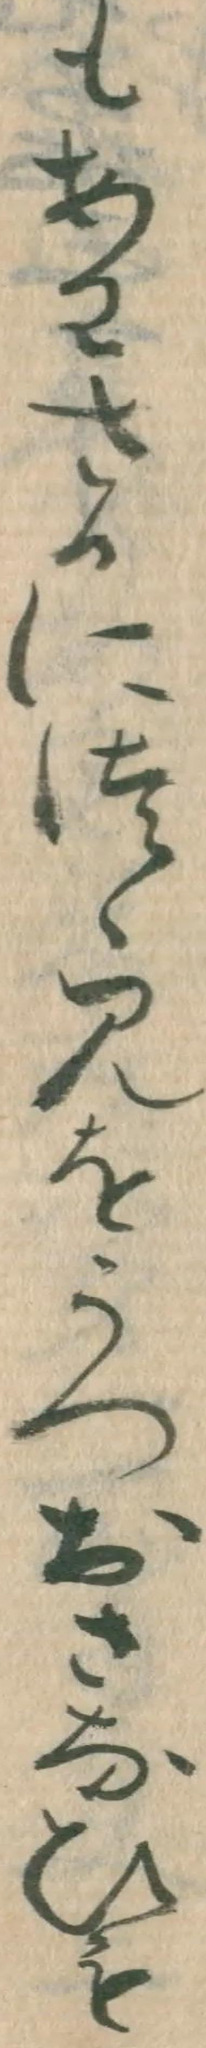もあわさるにつゝみをうつおさなひも
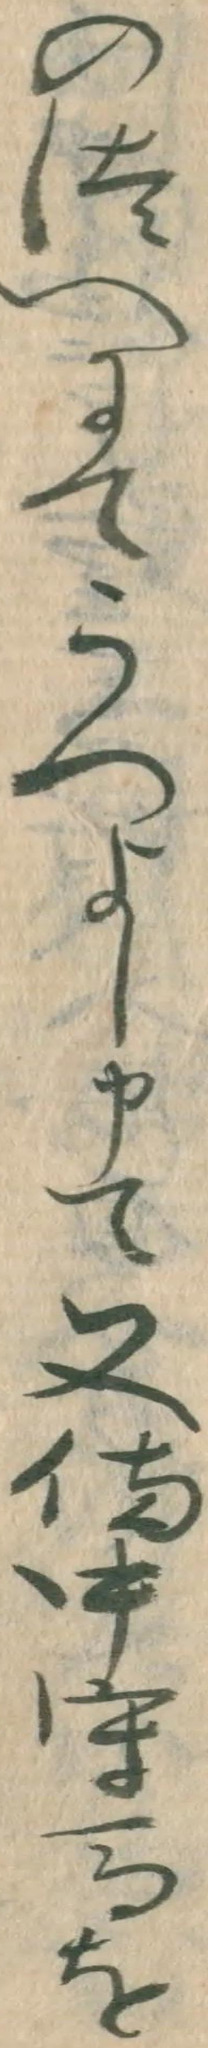のつへにてうつよし申て又備中守馬を
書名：賀茂社記録. 第10冊
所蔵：国立国会図書館 National Diet Library, JAPAN
